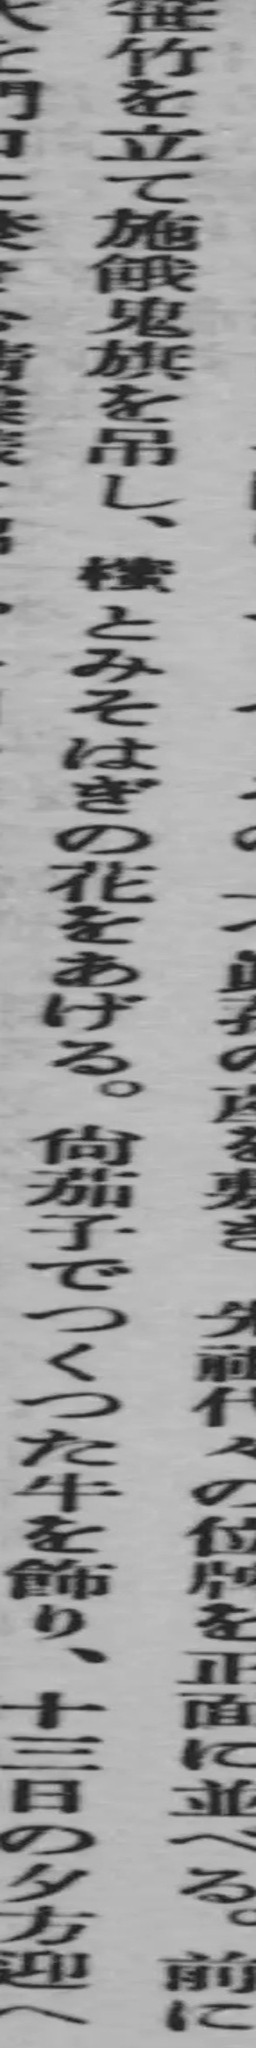笹竹を立て施餓鬼旗を吊し、櫁とみそはぎの花をあげる。尚茄子でつくつた牛を飾り、十三日の夕方迎へ
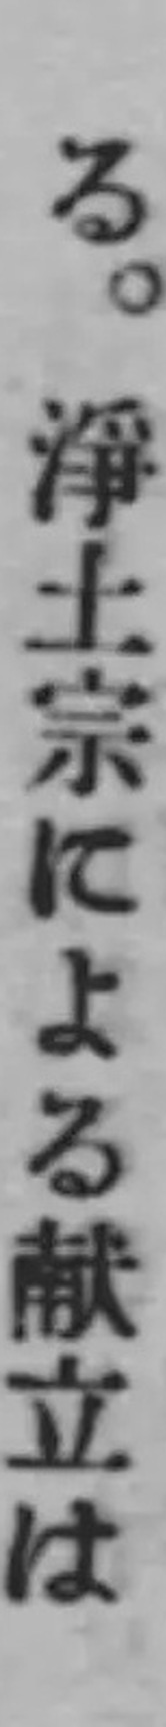る。淨土宗による献立は
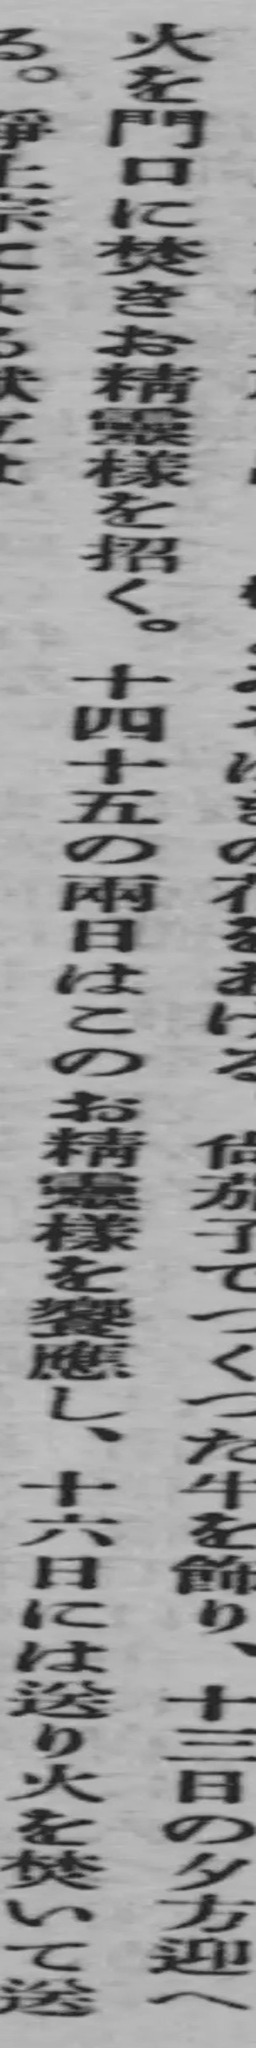火を門口に焚きお精靈様を招く。十四十五の兩日はこのお精靈様を饗應し、十六日には送り火を焚いて送
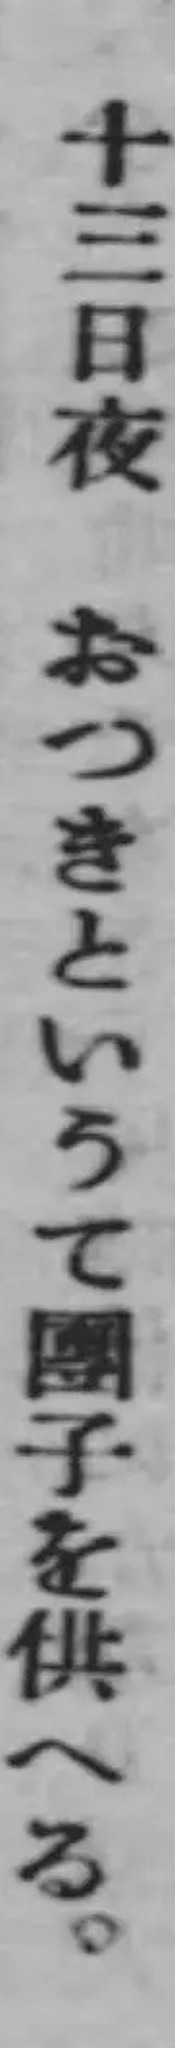十三日夜おつきというて團子を供へる。
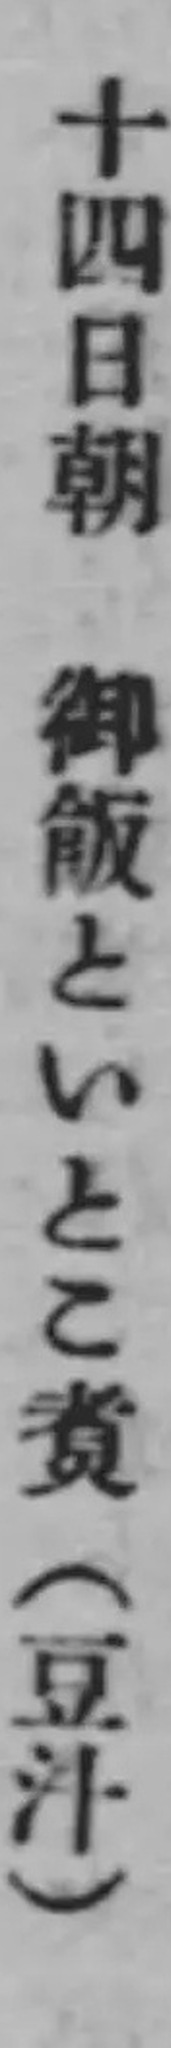十四日朝御飯といとこ煑(豆汁)
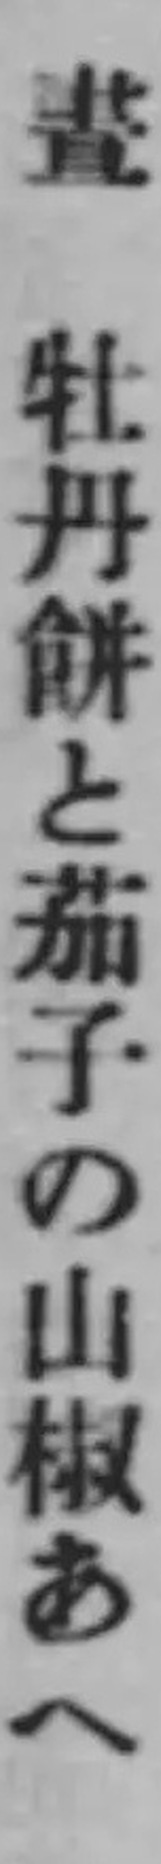晝牡丹餅と茄子の山椒あへ
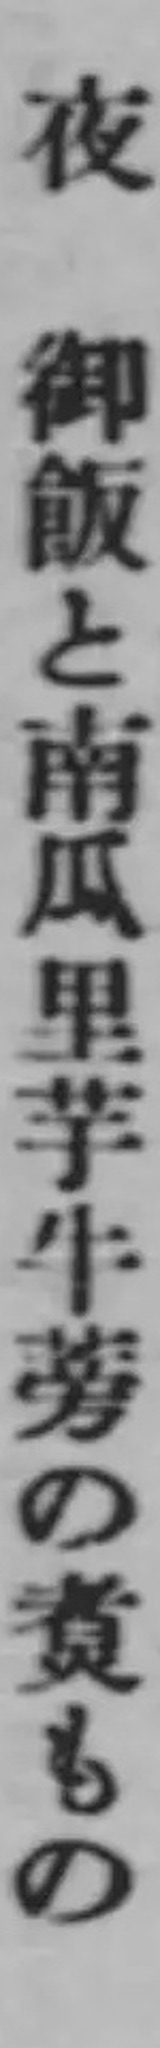夜御飯と南瓜里芋牛蒡の煑もの
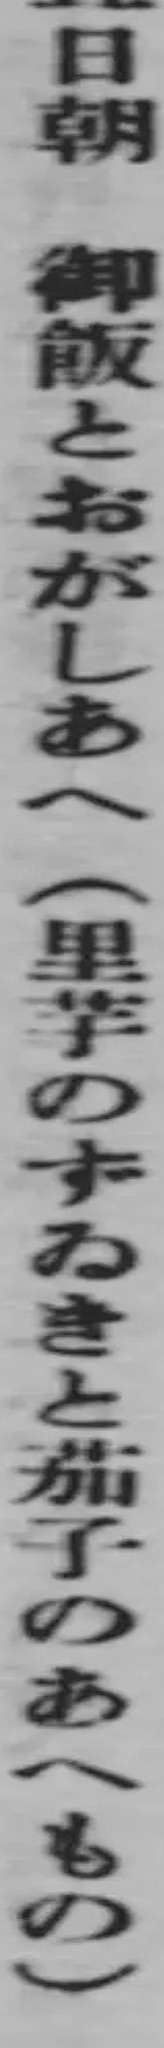十五日朝御飯とおがしあへ(里芋のずゐきと茄子のあへもの)
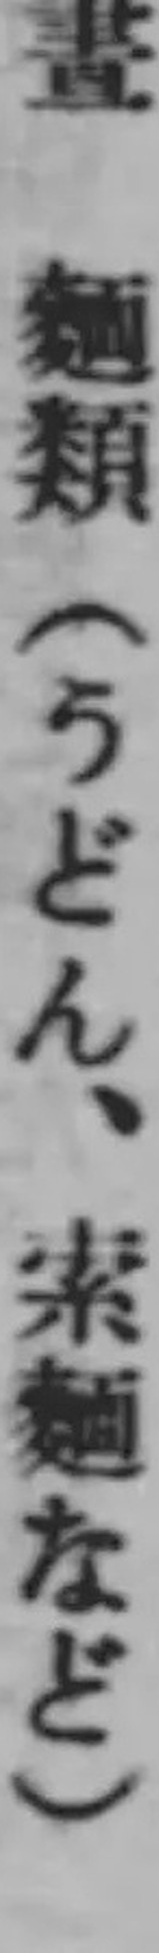晝麵類(うどん、索麵など)
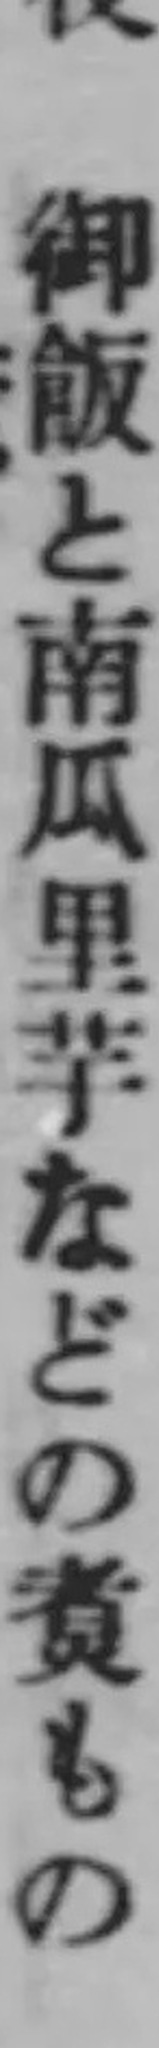夜御飯と南瓜里芋などの煑もの
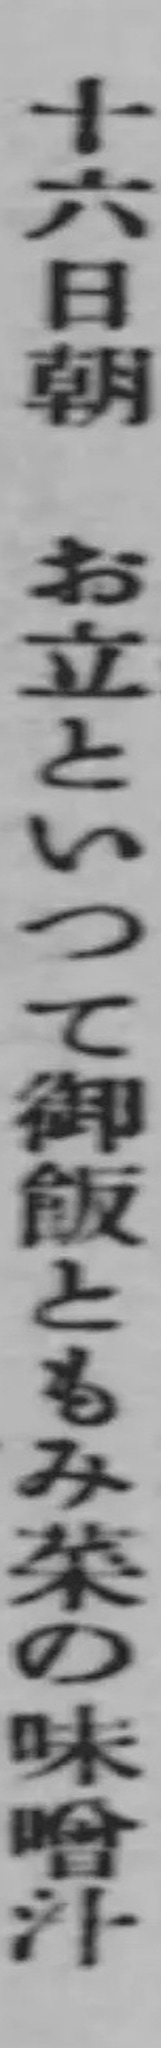十六日朝お立といつて御飯ともみ菜の味噌汁
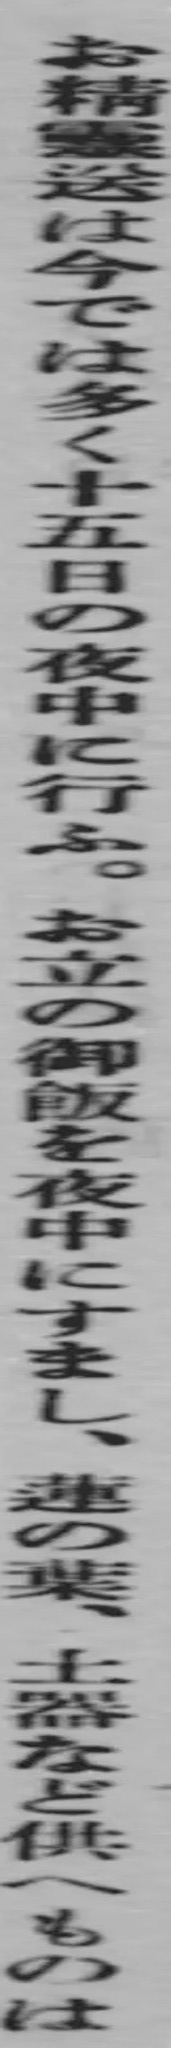お精靈送は今では多く十五日の夜中に行ふ。お立の御飯を夜中にすまし、蓮の葉、土器など供へものは
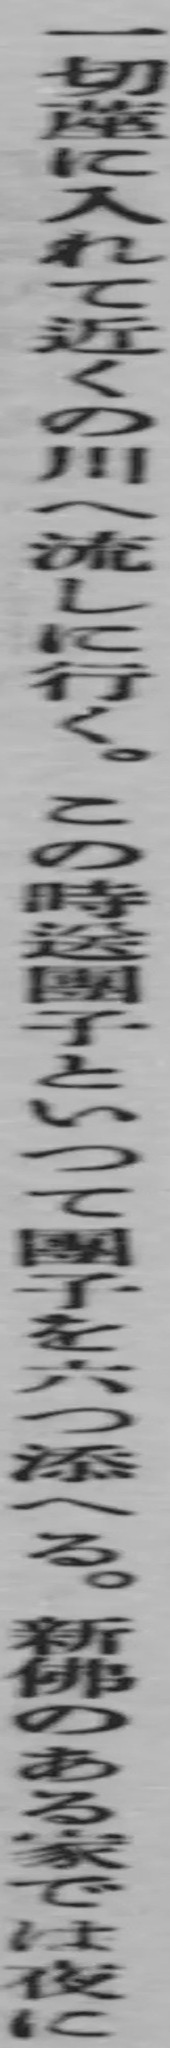一切蓙に入れて近くの川へ流しに行く。この時送團子といつて團子を六つ添へる。新佛のある家では夜に
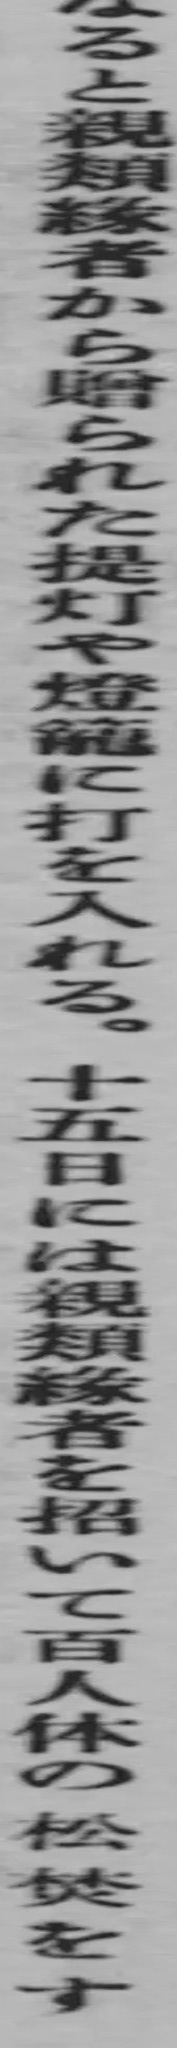なると親類緣者から贈られた提灯や燈籠に打を入れる。十五日には親類緣者を招いて百人体の松焚をす
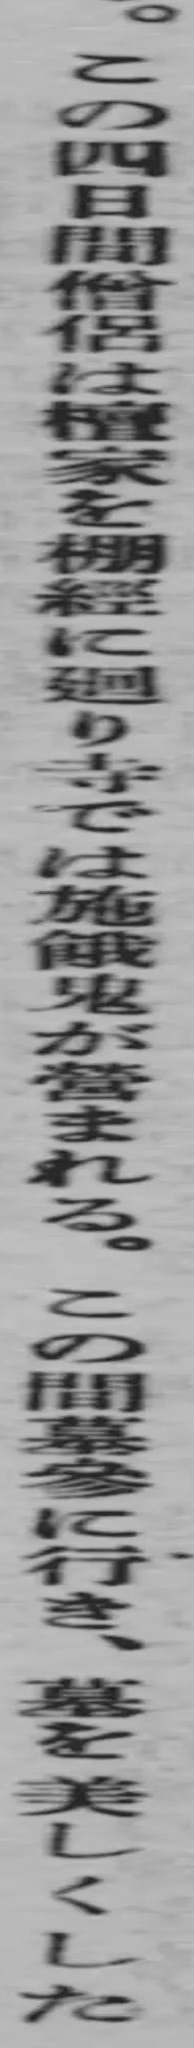る。この四日間僧侶は檀家を棚經に廻り寺では施餓鬼が營まれる。この間墓參に行き、墓を美しくした
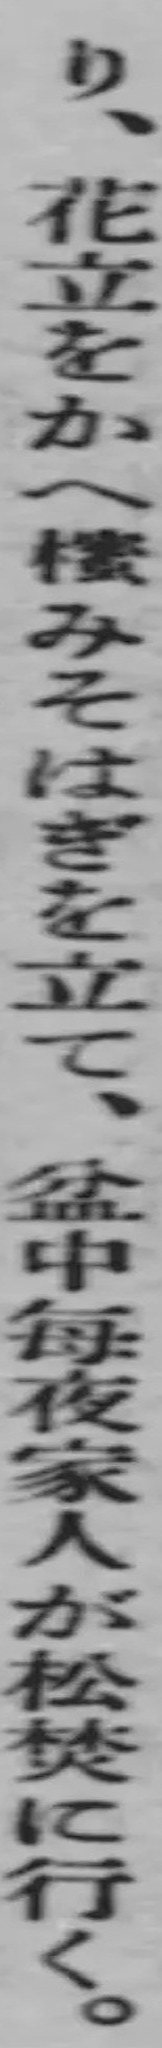り、花立をかへ櫁みそはぎを立て、盆中每夜家人が松焚に行く。
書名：豊橋の年中行事
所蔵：国立国会図書館 National Diet Library, JAPAN
